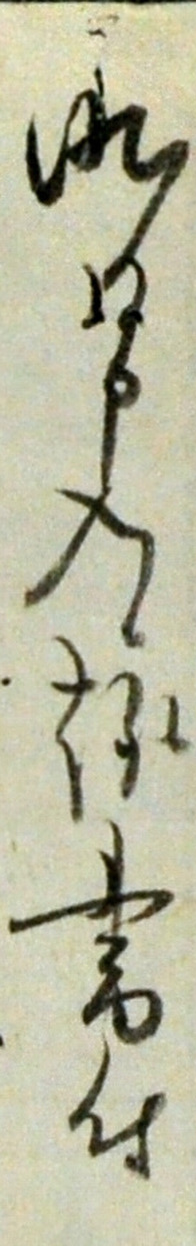昨日申入候趣書付
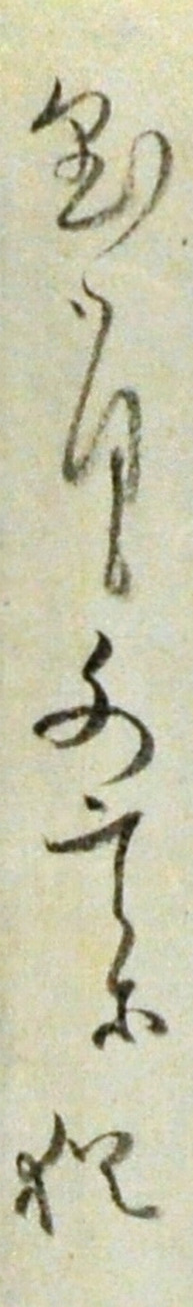懸御目候文言に猶
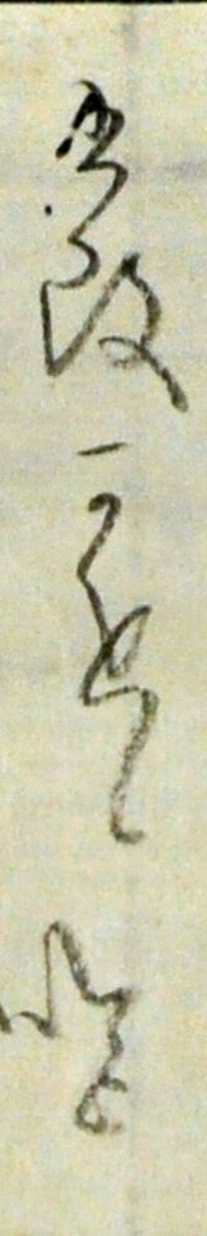書改可進候以上
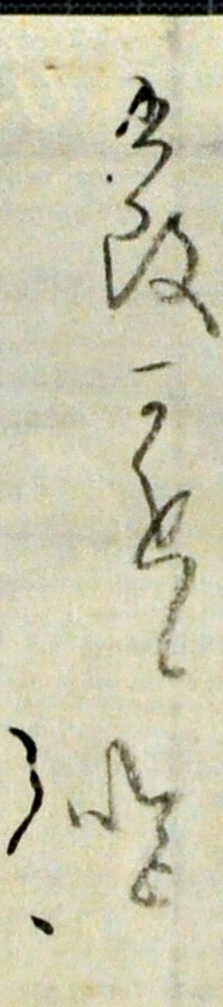書改可進候以上
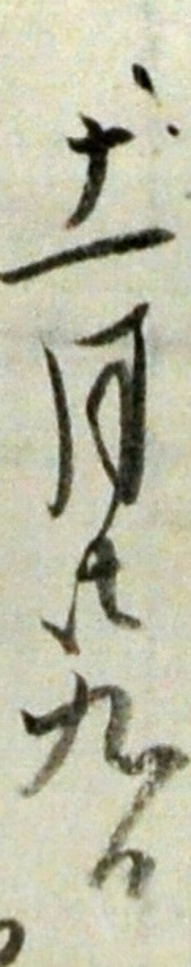十一月廿九日
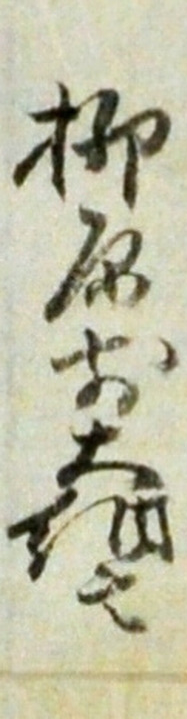柳原前大納言
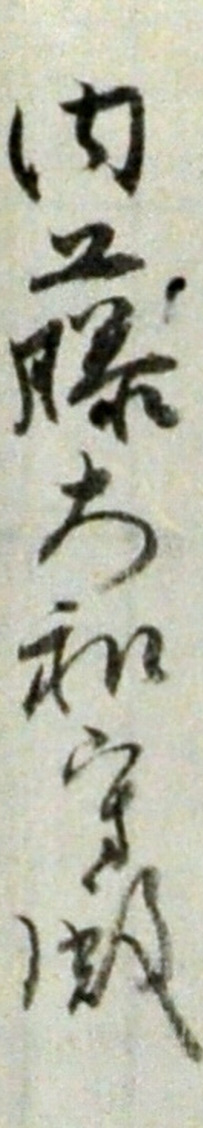内藤大和守殿
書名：書状
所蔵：伊那市立高遠町図書館・合同会社AMANE
